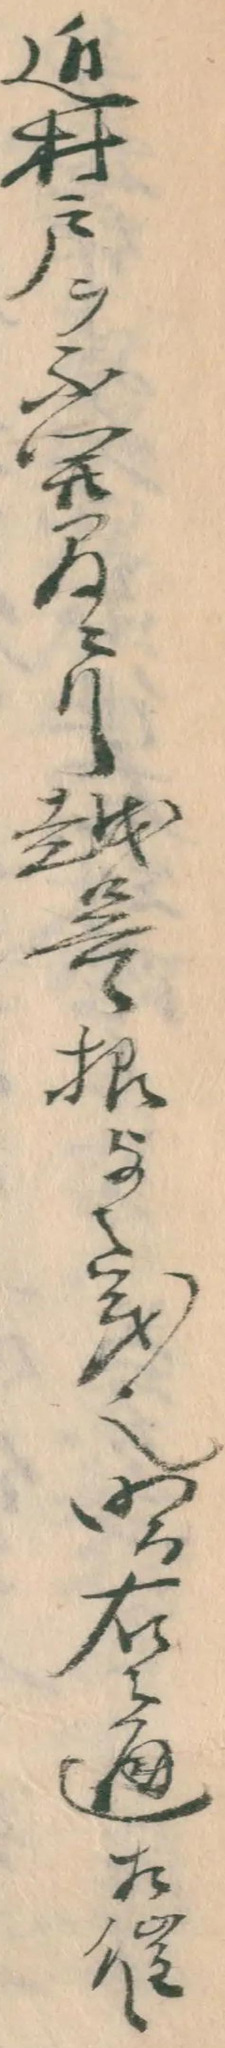近村戸を不開間二引越呉候様与之義也仍而右之通相催し
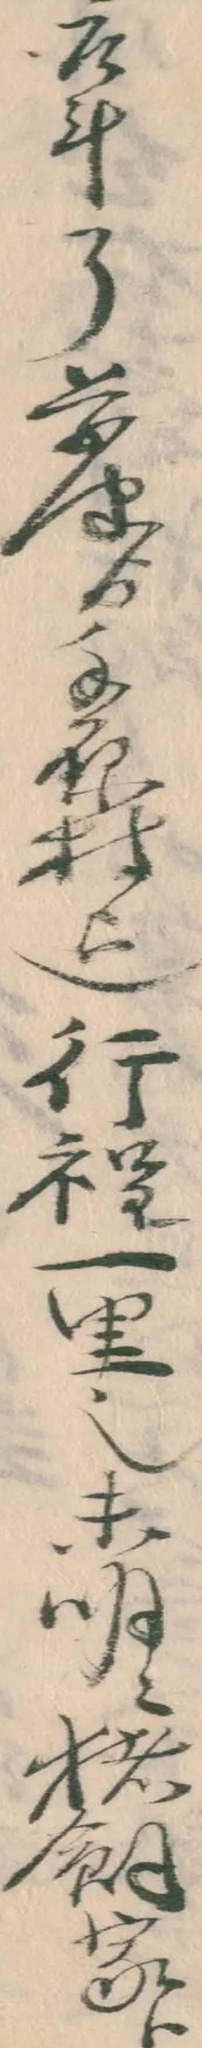取斗了草津ゟ手原村迄行程一里也未明二猪飼家え
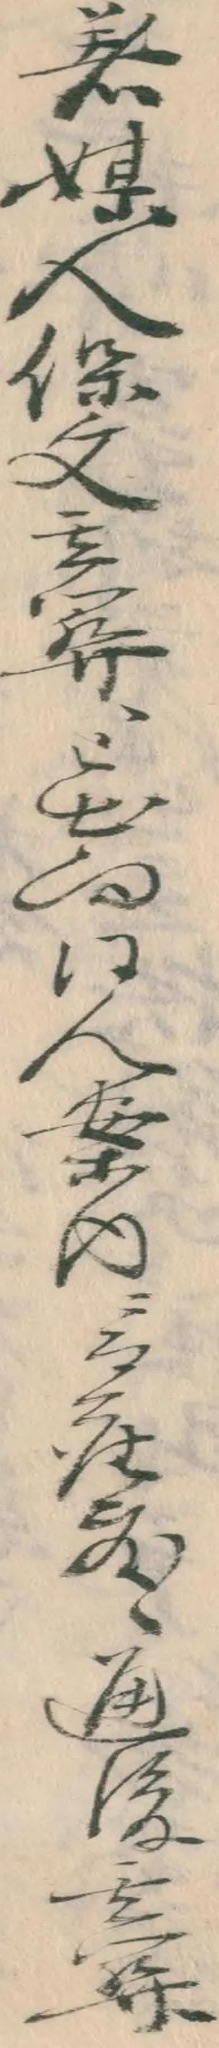着媒人保文玄関へ被出向同人案内ニ而座敷ヘ通後玄関
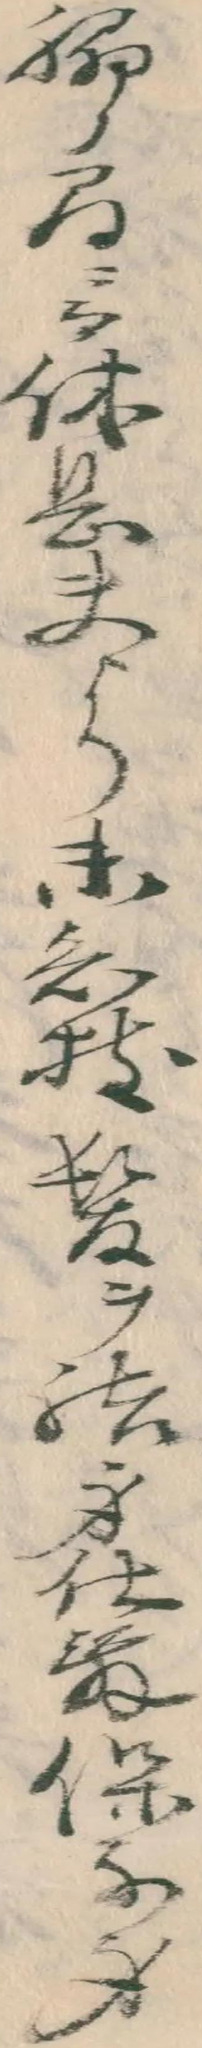脇の間ニ而休息夫より未知技髪ヲ結身仕舞保子身
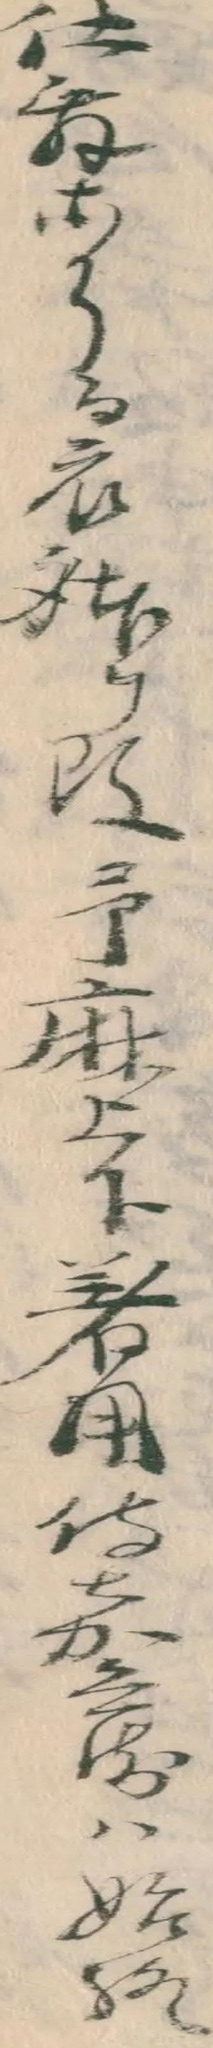仕舞等了而衣躰ヲ改予麻上下着用侍嘉兵衛ハ始終
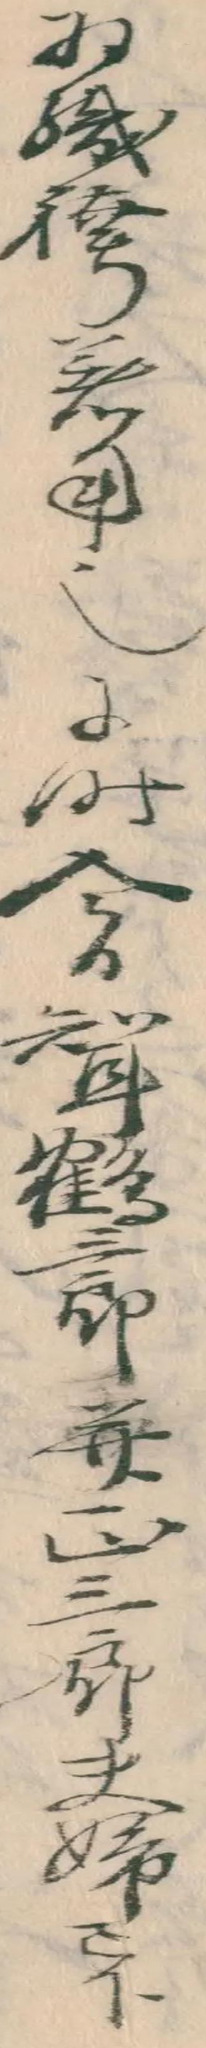羽織袴着用也に時今日聟鶴三郎并正三郎夫婦已下
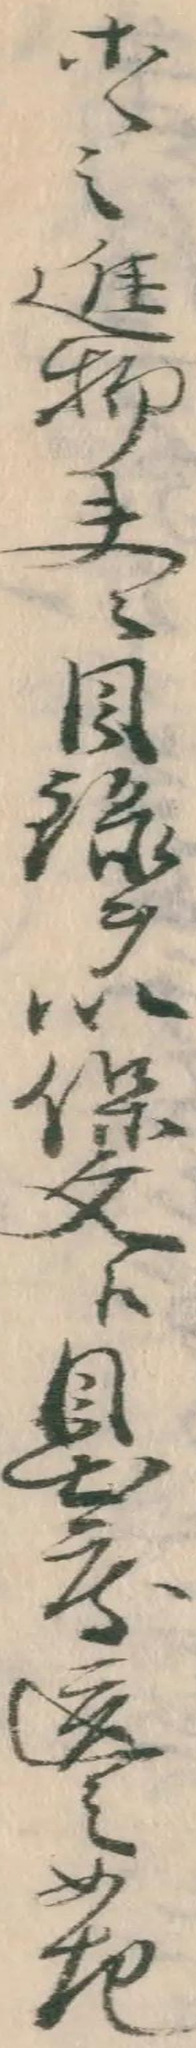等へ之進物夫々目録ヲ以保文え目出度送之如左
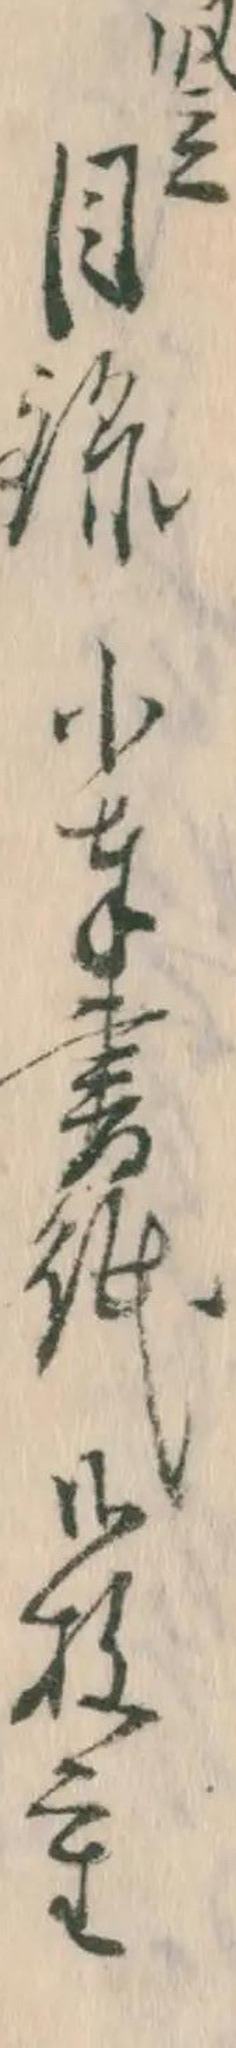堅目録小奉書紙弐枚重
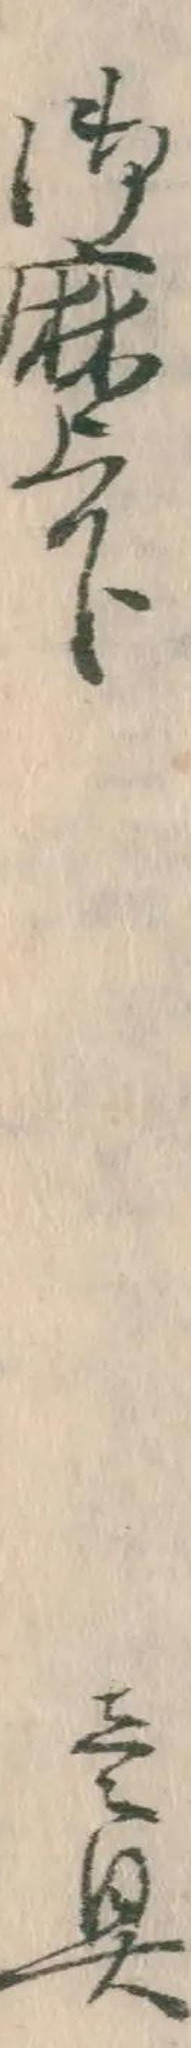御麻上下壱具
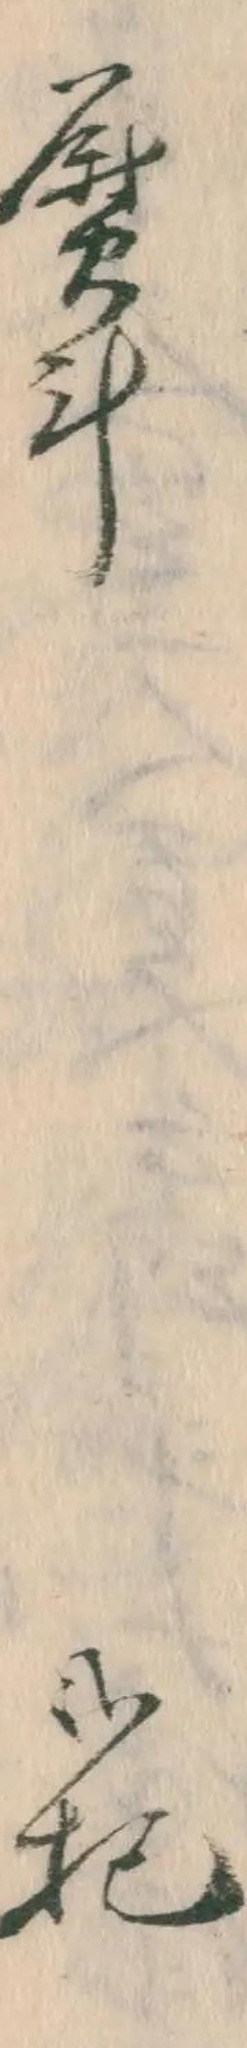熨斗弐把
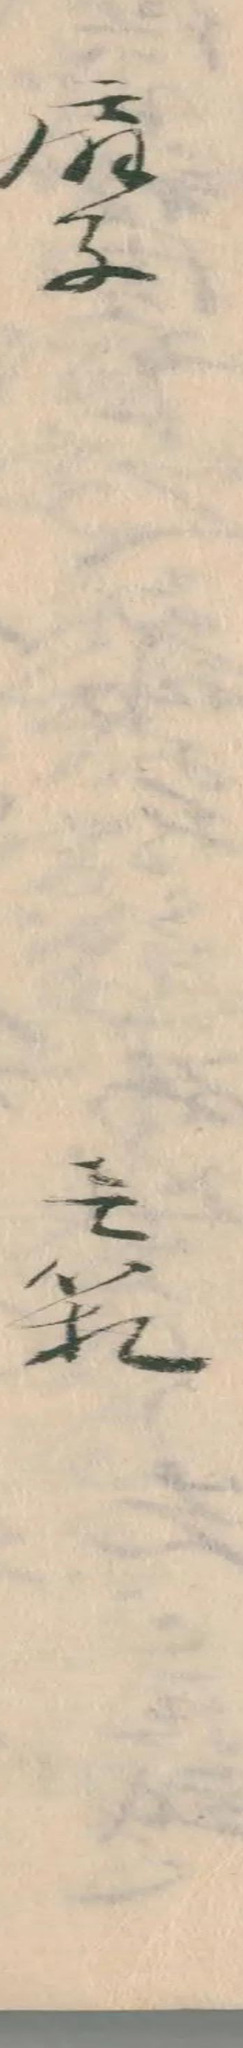扇子壱箱
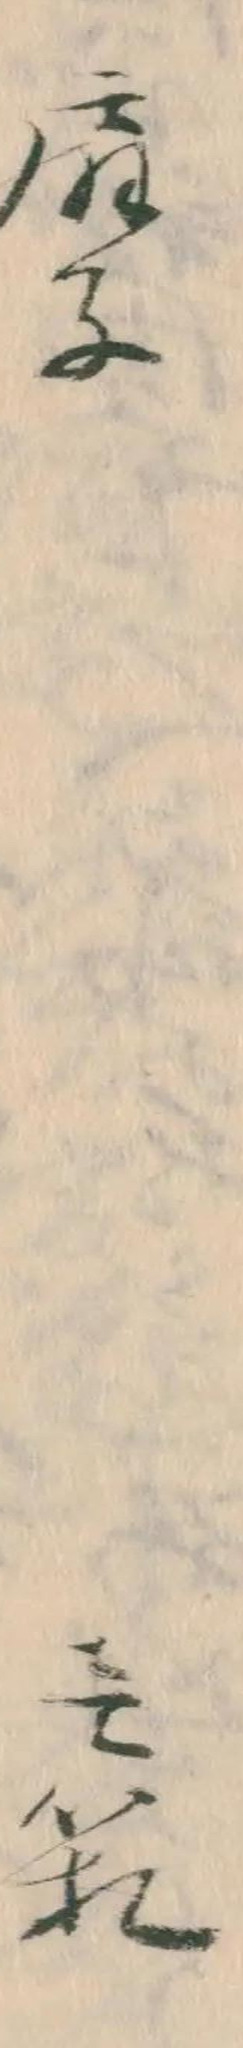扇子壱箱
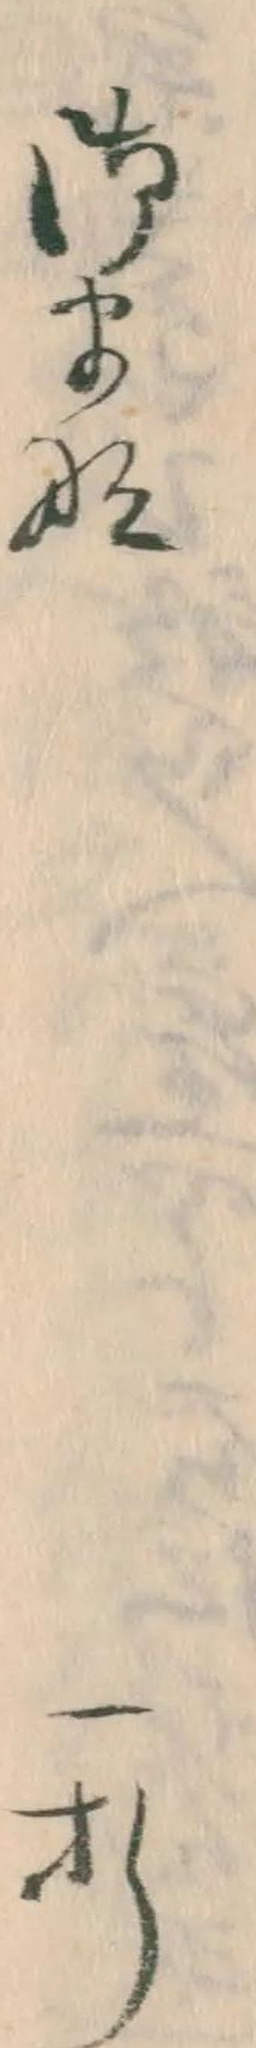御まな一折
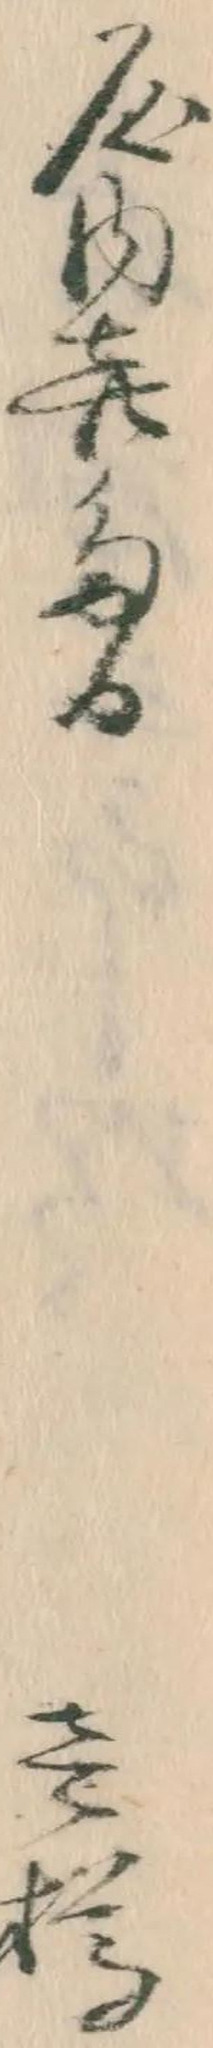屋内喜たる壱樽
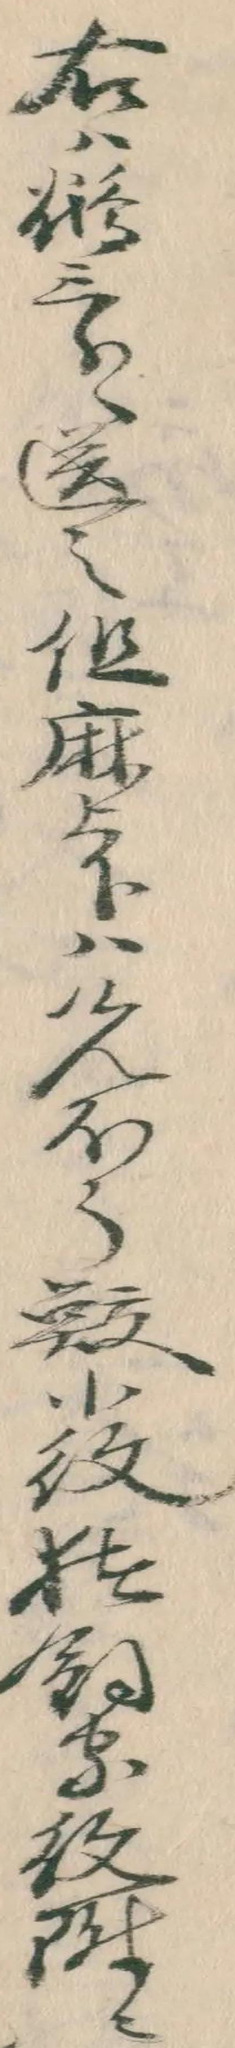右ハ三郎へ送之但麻上下ハ先ほう鮫小紋猪飼家紋附ニ
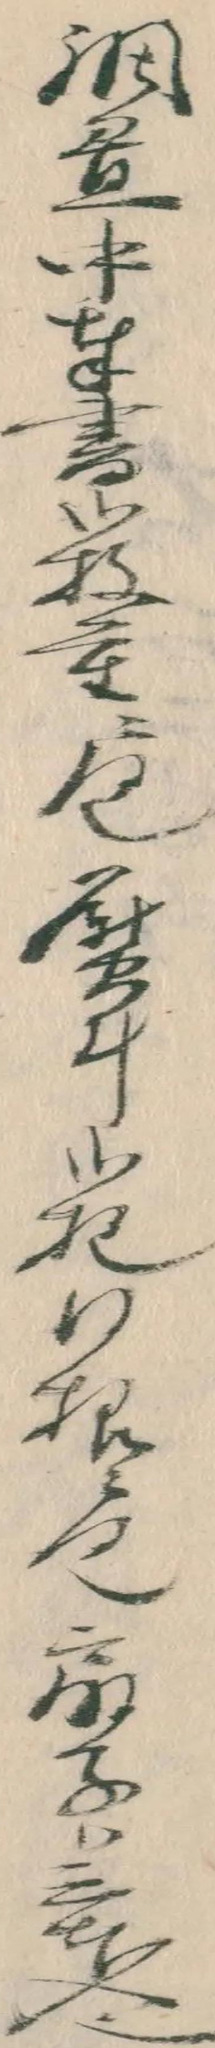調置中奉書弐枚重ニ包熨斗弐把同様ニ包扇子御三本入也
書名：賀茂社記録. 第66冊
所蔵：国立国会図書館 National Diet Library, JAPAN
